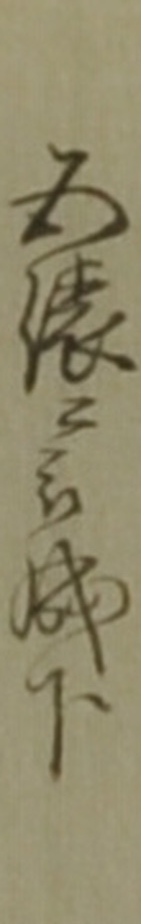五俵被成下
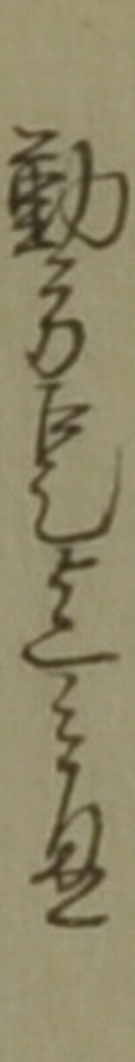近勤方是迄之通
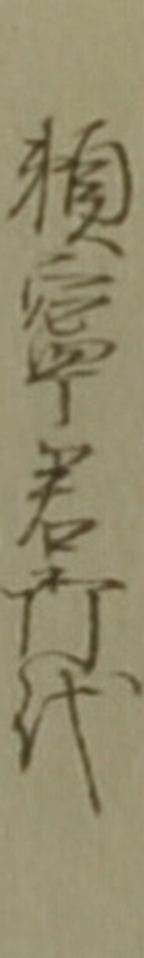頼寧君御代
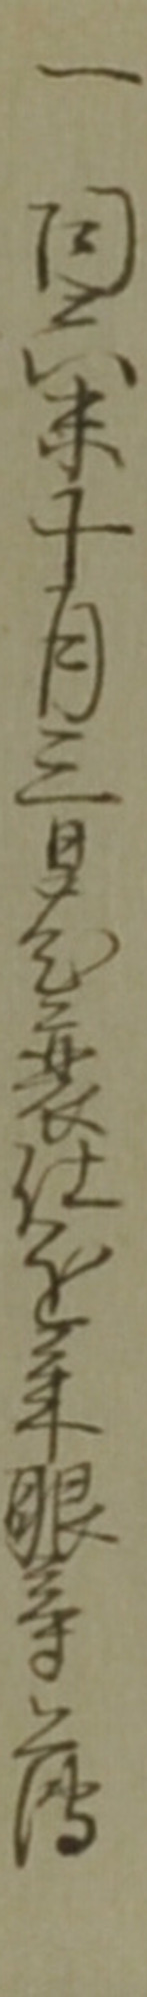一同六未十月三日老衰仕近年眼等薄
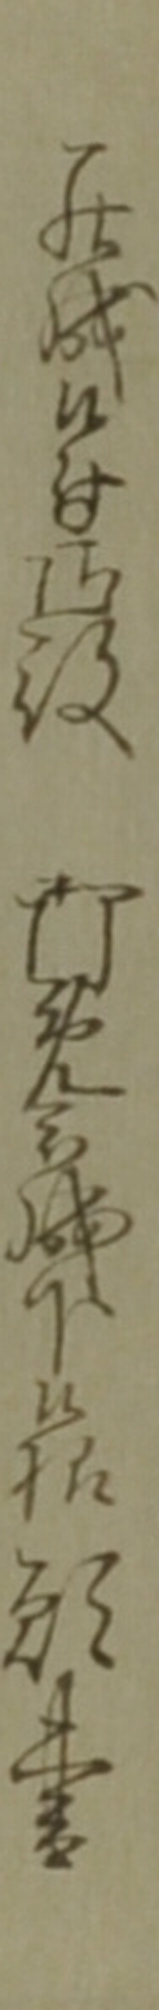罷成候付御役御免被成下候様願書
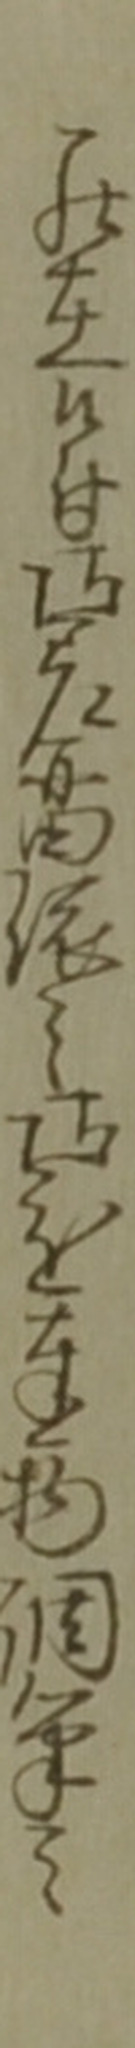罷在候付御差留依之御進達物調筆之
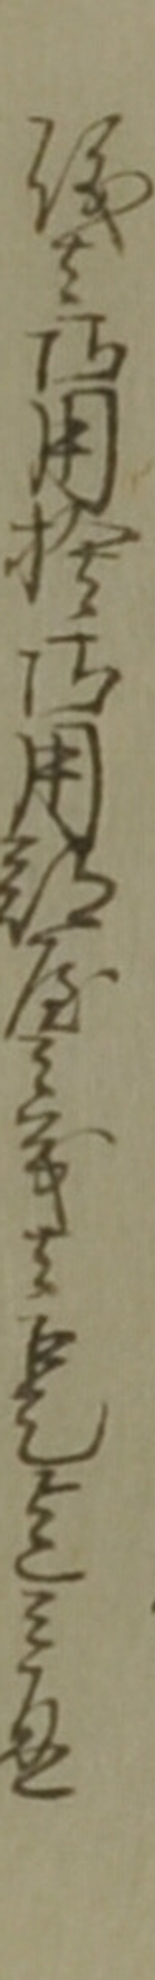儀者御用捨御用部屋之義者是迄之通
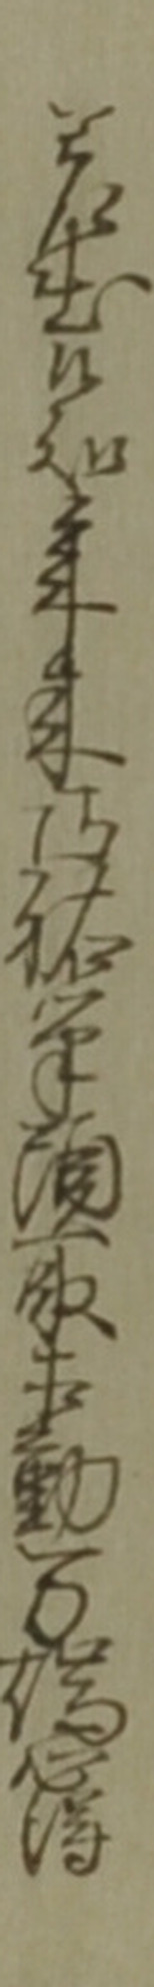差出候処年来御祐筆頭取相勤万端心得
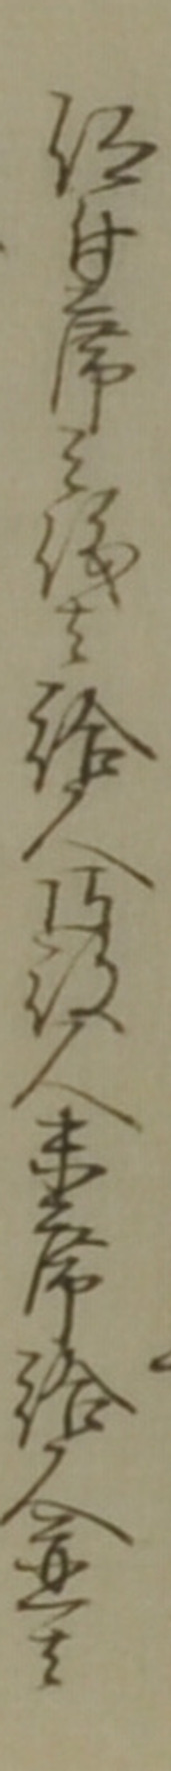仰付席之儀者給人御役人末席給人並者
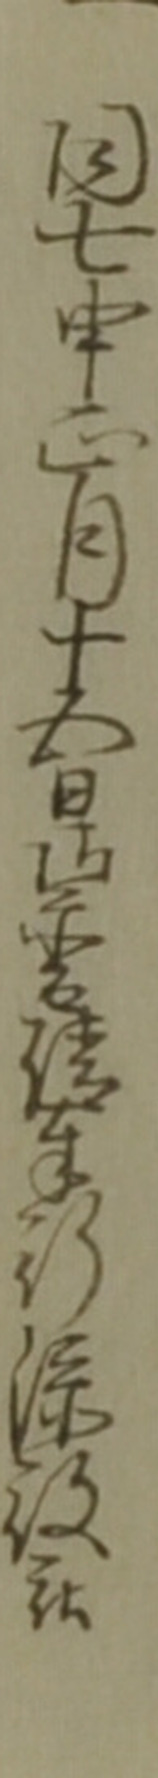一同七申正月十五日御普請奉行添役被
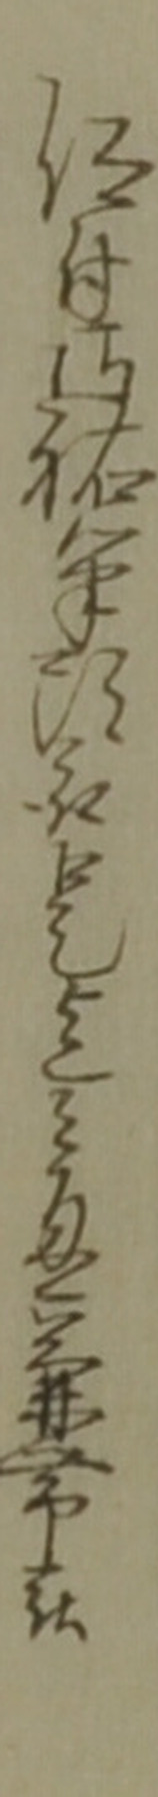仰付御祐筆頭取是迄之通兼帯被
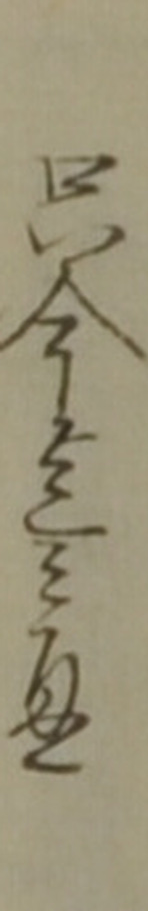只今迄之通
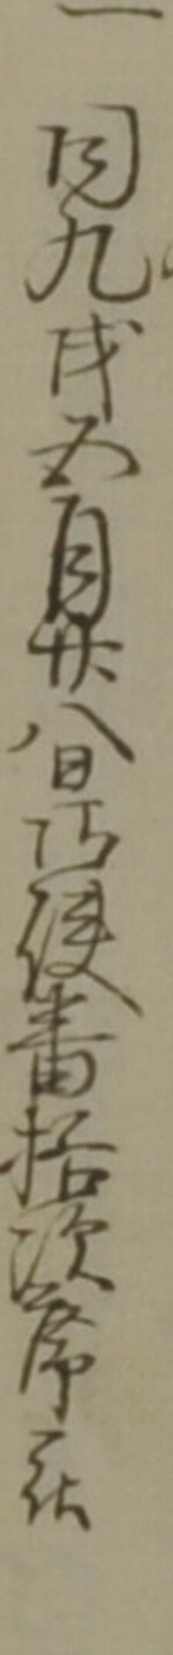一同九戌五月廿八日御使番格次席被
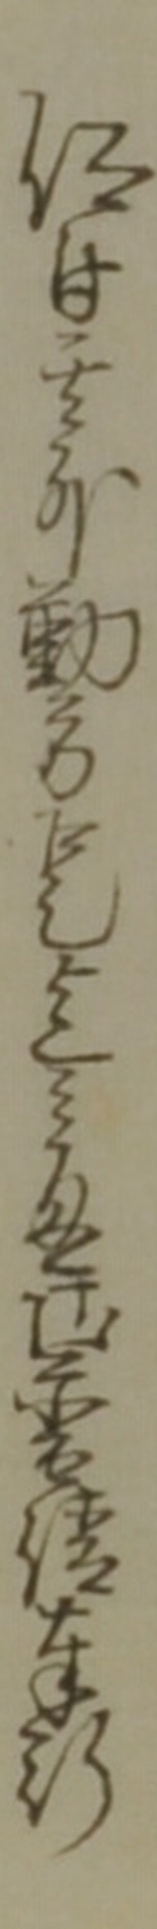仰付其外勤方是迄之通御普請奉行
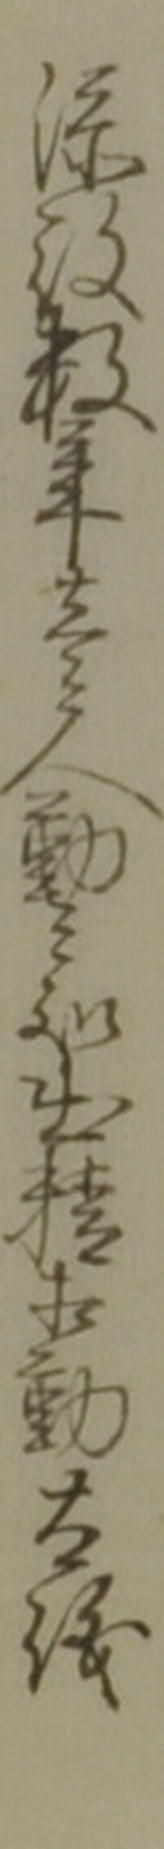添役数年壱人勤之処出精相勤太儀
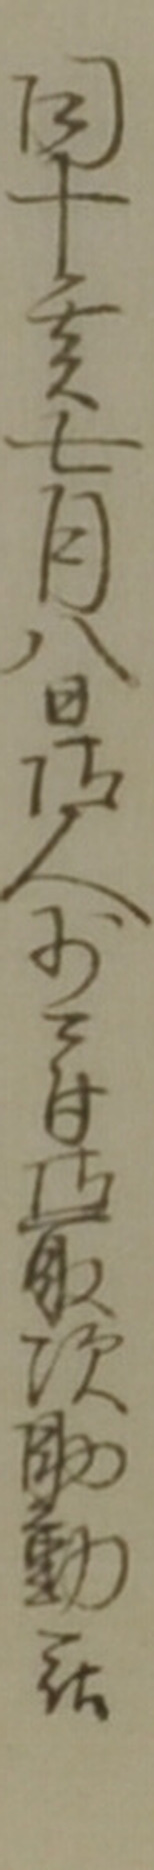一同十亥七月八日御人少ニ付御取次助勤被
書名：無足廃家（弐）
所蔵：伊那市立高遠町図書館・合同会社AMANE
